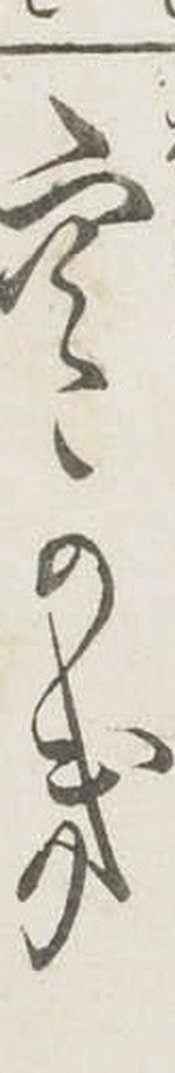空かき
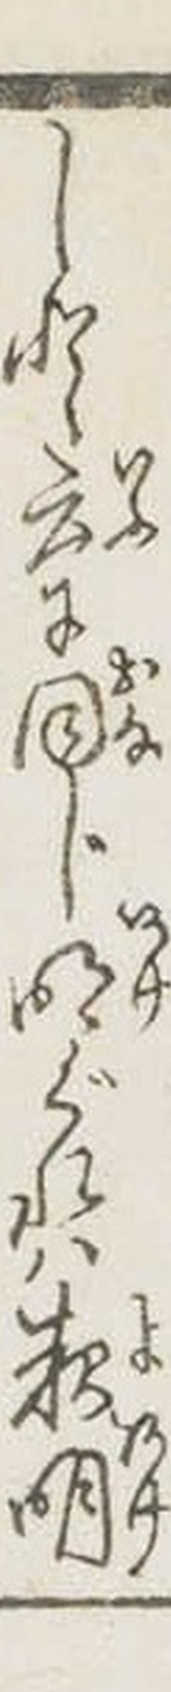しと云は同じ明ぐれは夜明
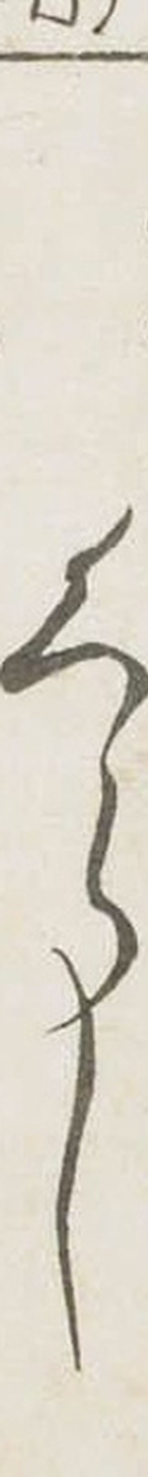くらし
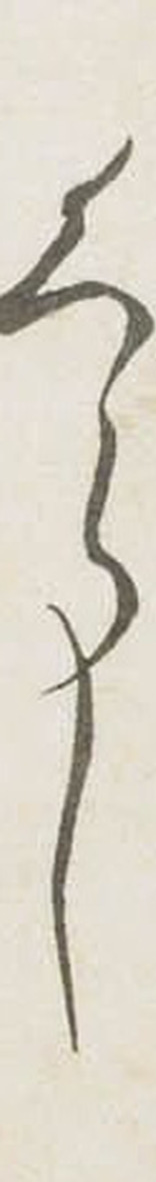くらし
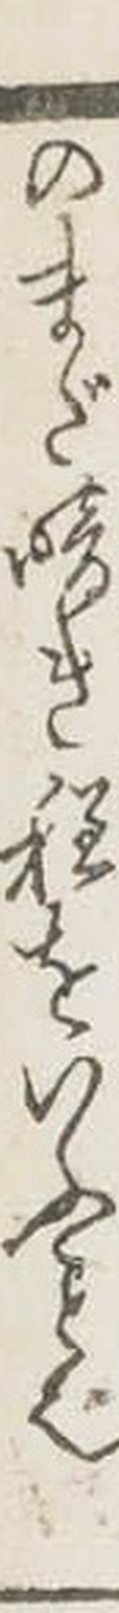のまだ暗き程をいふこと也
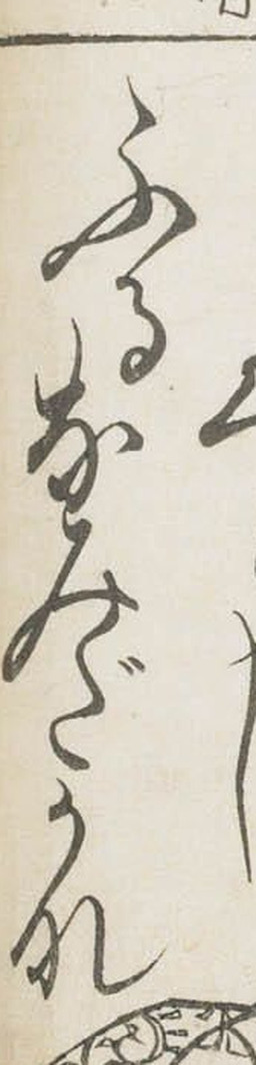ふるなみだかな
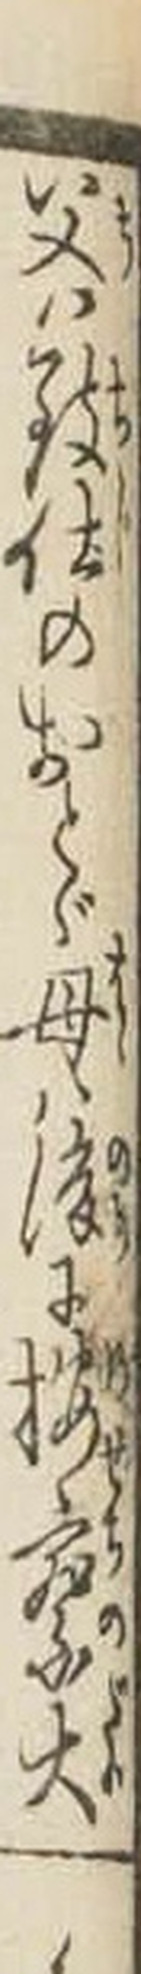父は致仕のおとゞ母は後に按察大
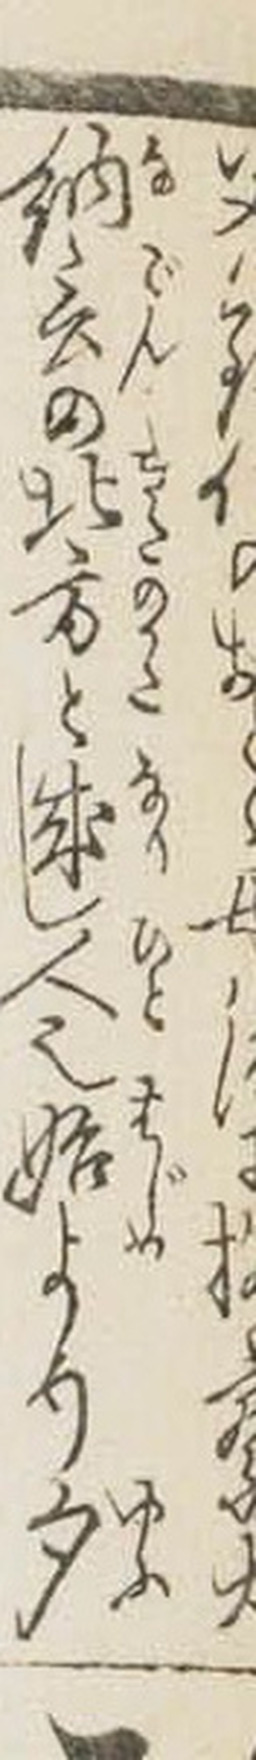納言の北方と成し人也始より夕
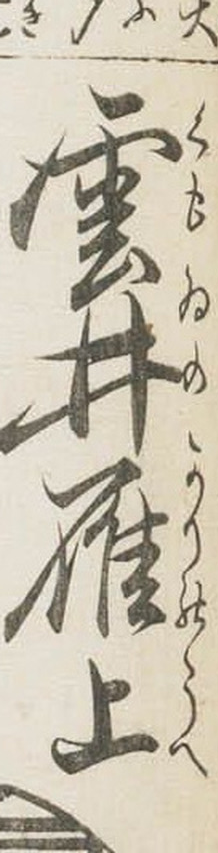雲井雁上
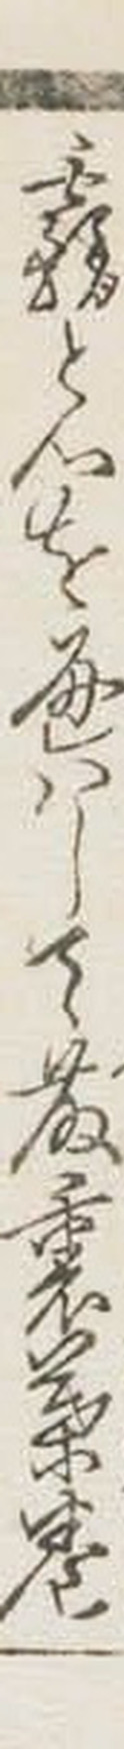霧と心を通はして藤裏葉巻
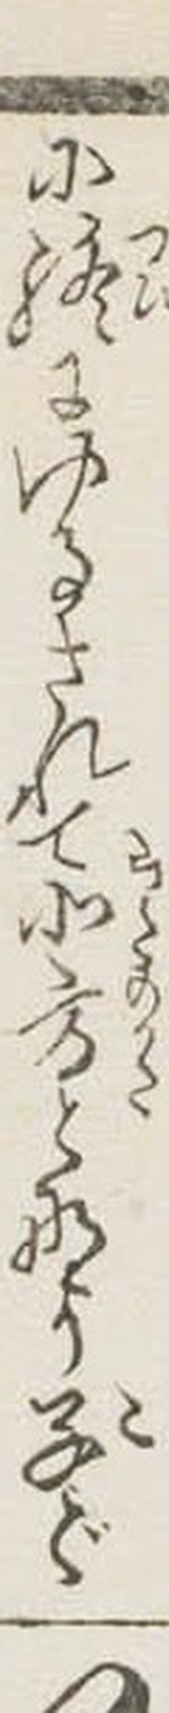に終にゆるされて北方となり子ど
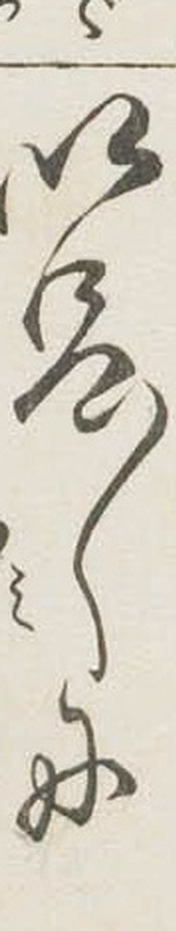いろ〳〵に
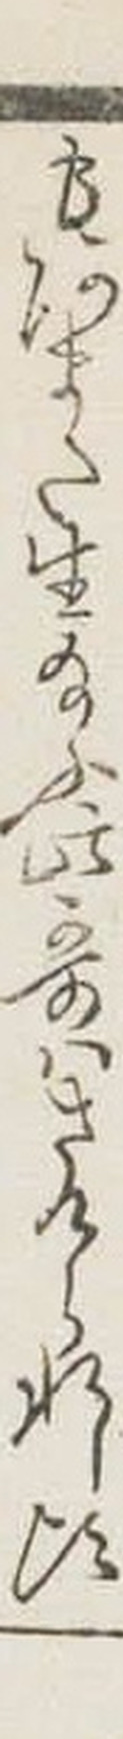もあまた生給ふ此哥はさけられし頃
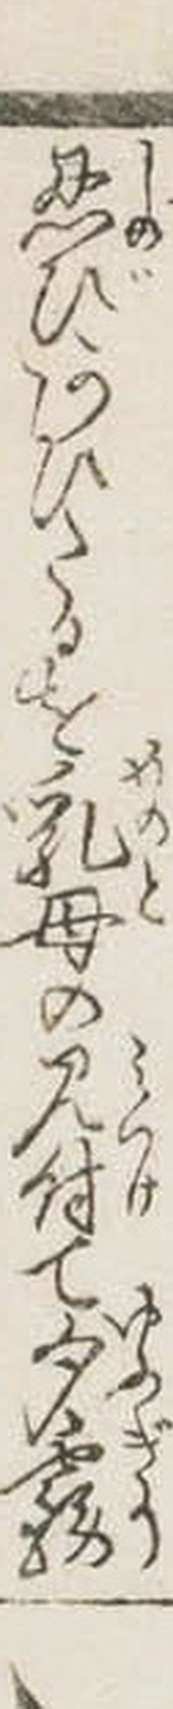忍びあひたるを乳母の見付て夕霧
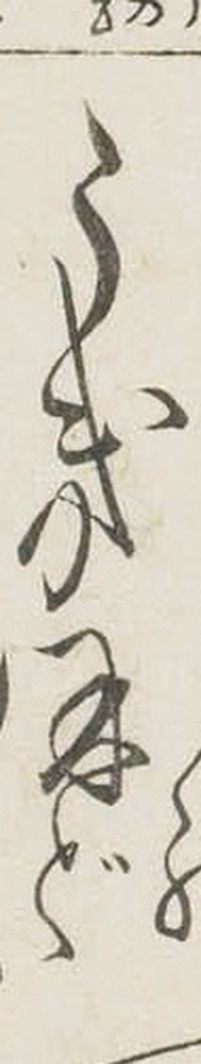うきほど
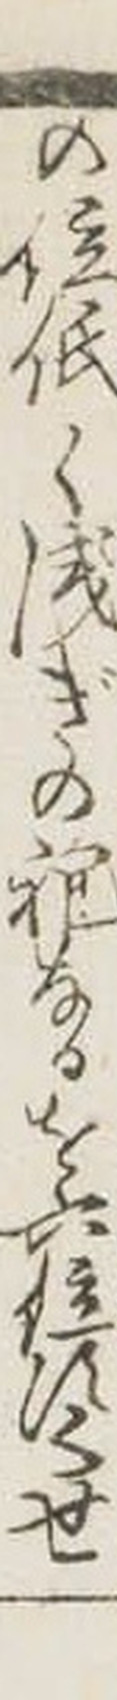の位低く浅ぎの袍なるを六位すくせ
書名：源氏百人一首
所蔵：東京学芸大学教育コンテンツアーカイブ
